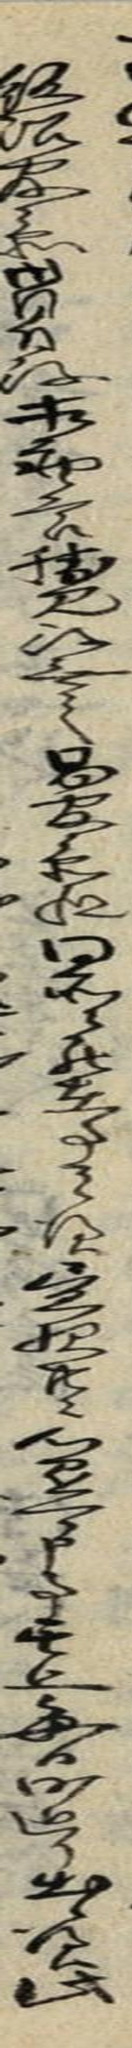飯嶋官兵衛御目付役相勤候節勝見役無之則官兵衛組同所へ罷在事に候得は昼夜共に心懸可申事其上毎日町廻り出候得は此
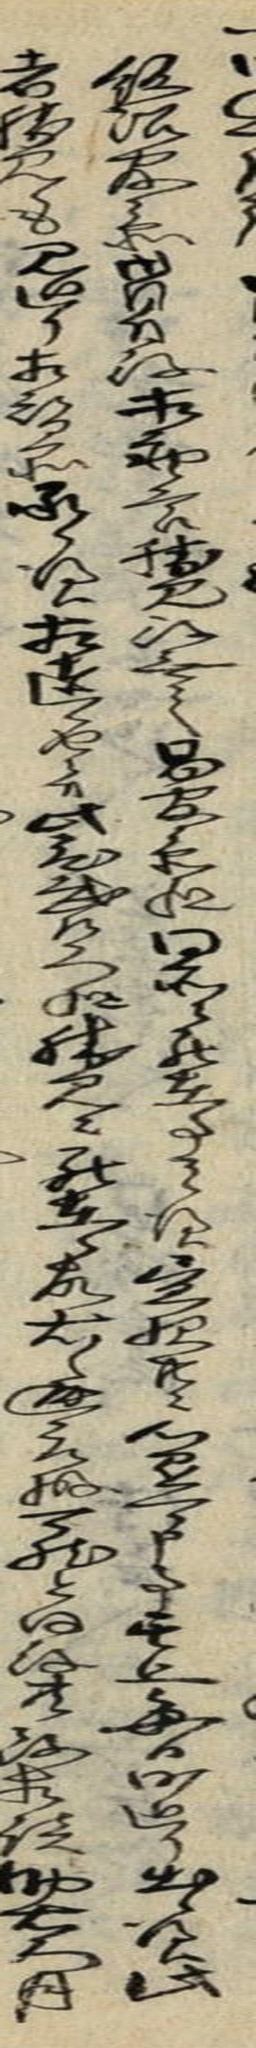者勝見へも見廻り相替品承候得は相達候由に付此度武左衛門組勝見に罷在候故右之通取扱可然と同役共致相談助右衛門月
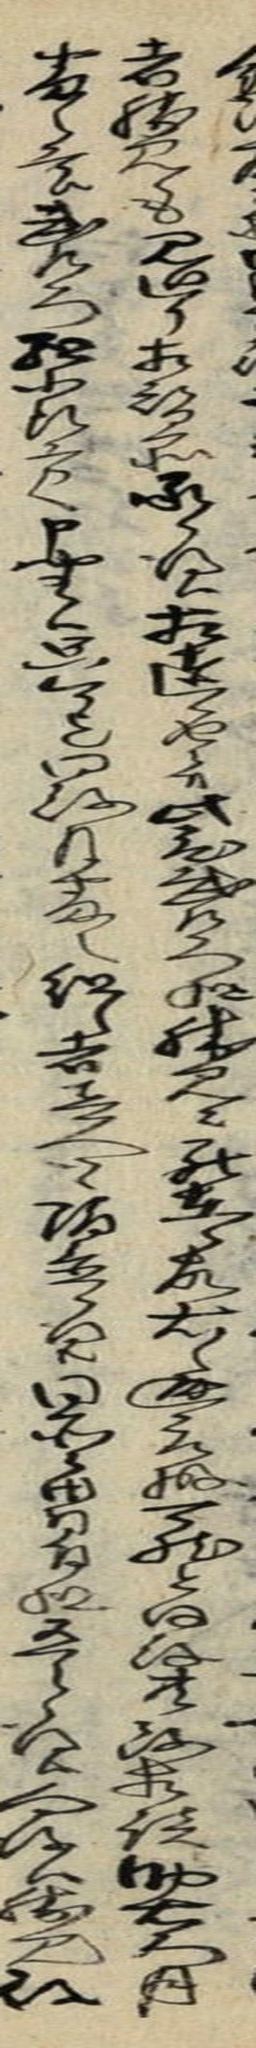番之節武左衛門組小頭方へ申聞候は只今迄同役月番之組之者壱人つゝ附置候得共同所に御目付組有之候得は向後は勝見役
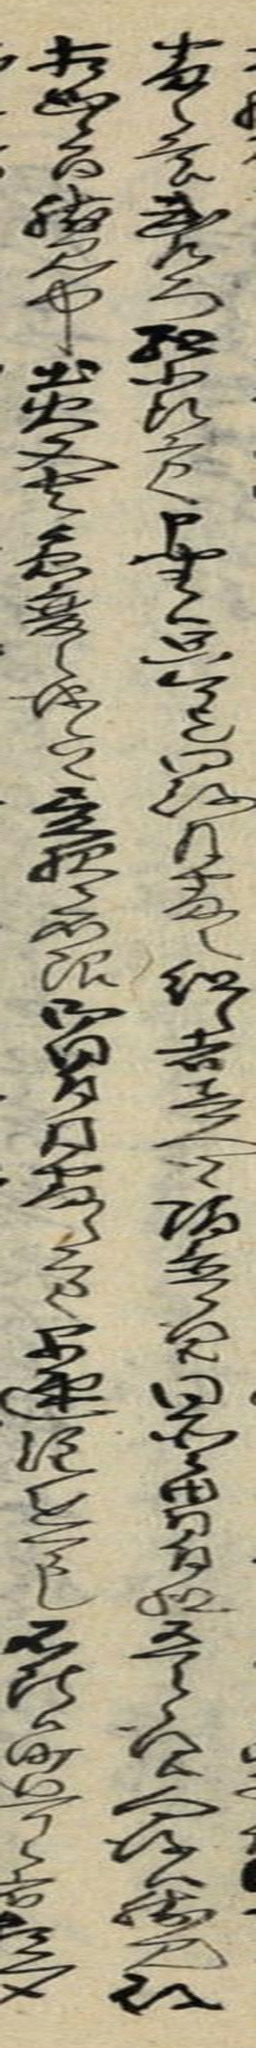相止候間勝見中出火又は急変之儀候はゝ昼夜に不限御目付月番御方へ早速注進可申候不断は町廻り之者朝夕
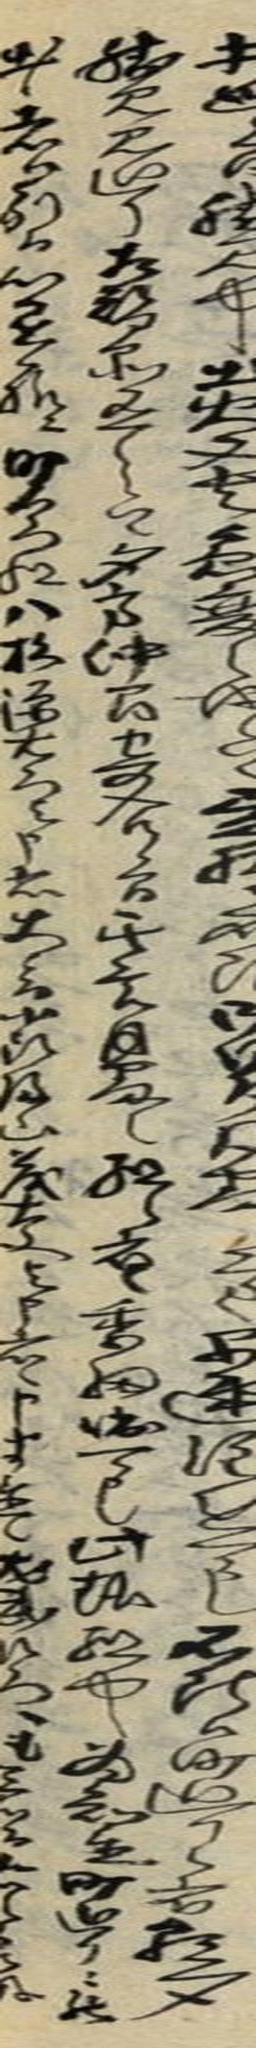出候者は別而心懸候様に助右衛門組八杉源右衛門と申者使に而小頭福山茂太夫と申者へ申聞置候尤武左衛門へも兼而右之取扱
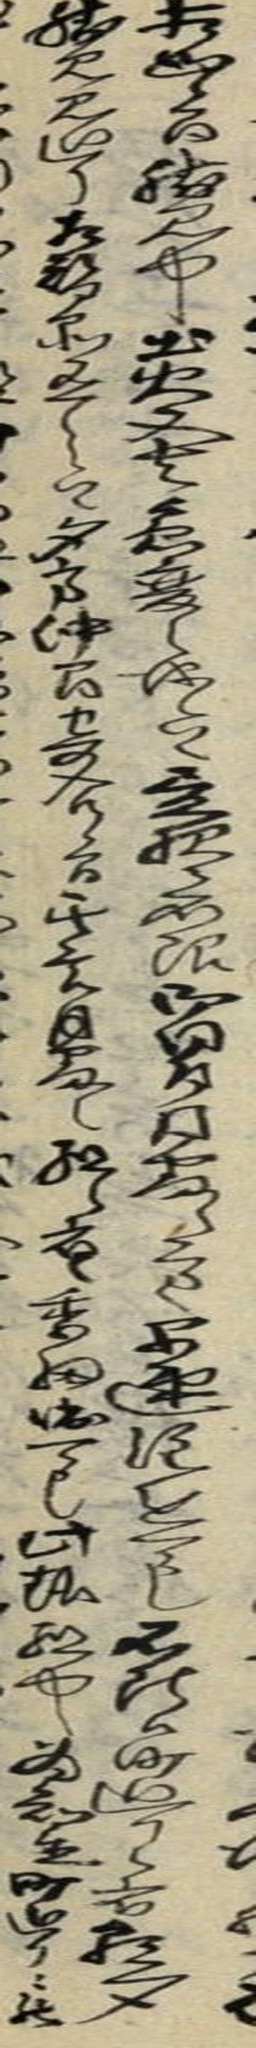勝見見廻り相替品有之候はゝ夕方仲間寄合候間其節月番之組之者へ委細咄可申候此趣組中為知置町廻りに罷
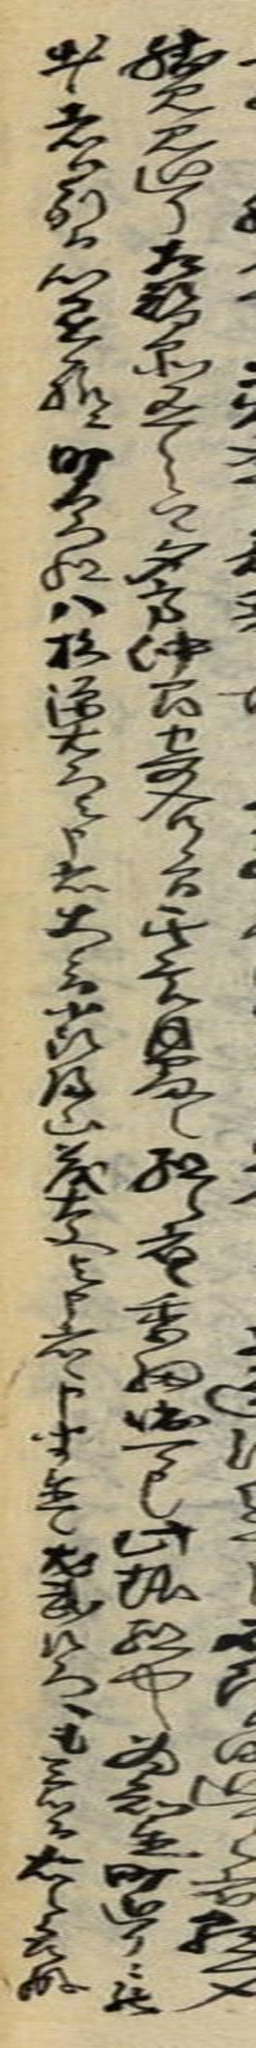出候者は別而心懸候様に助右衛門組八杉源右衛門と申者使に而小頭福山茂太夫と申者へ申聞置候尤武左衛門へも兼而右之取扱
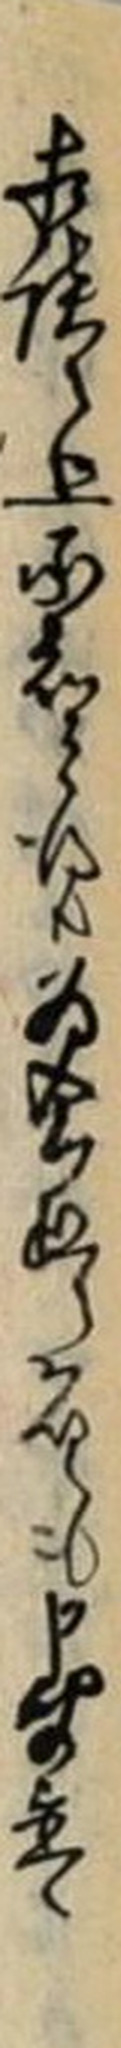相談之上承知に候得共為念組之者へも申聞置候
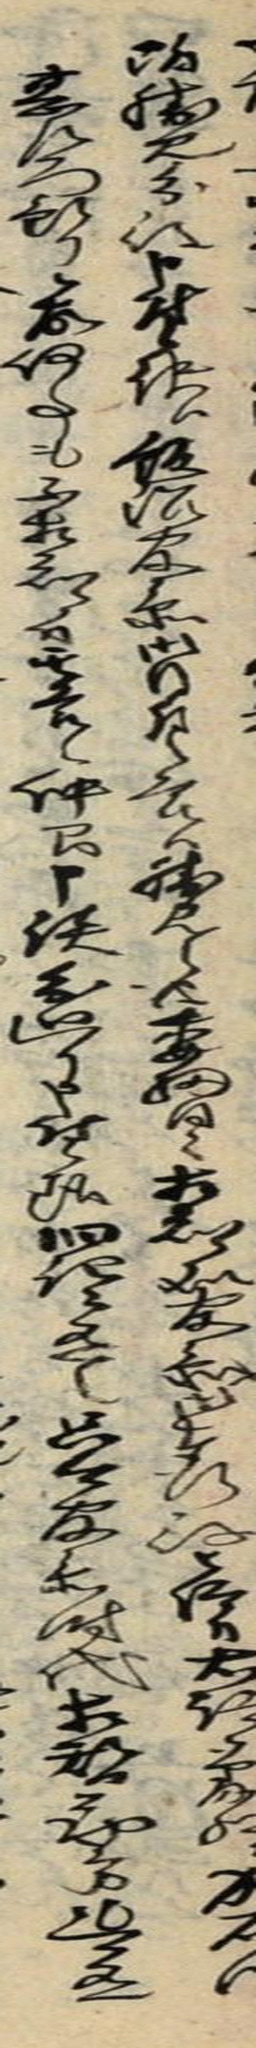甚左衛門預り候故何事も不相知候に付其節之仲間申談分廻り申付候趣旧記に有之只今官兵衛時代相替勤方も可有
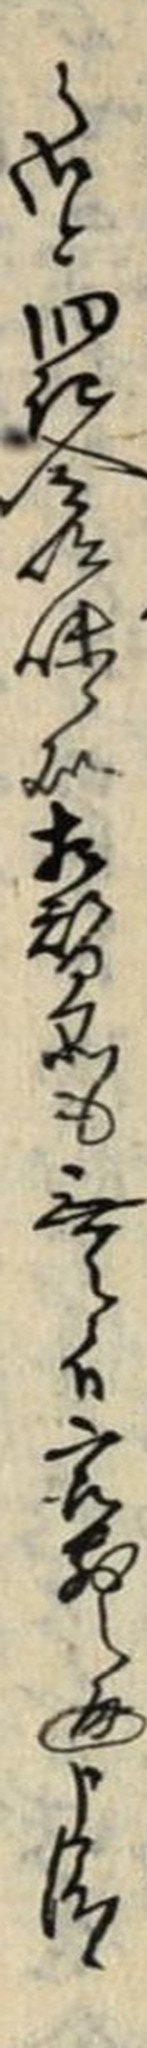之哉と旧記令吟味候処相替品も無之候付最前之通申渡候
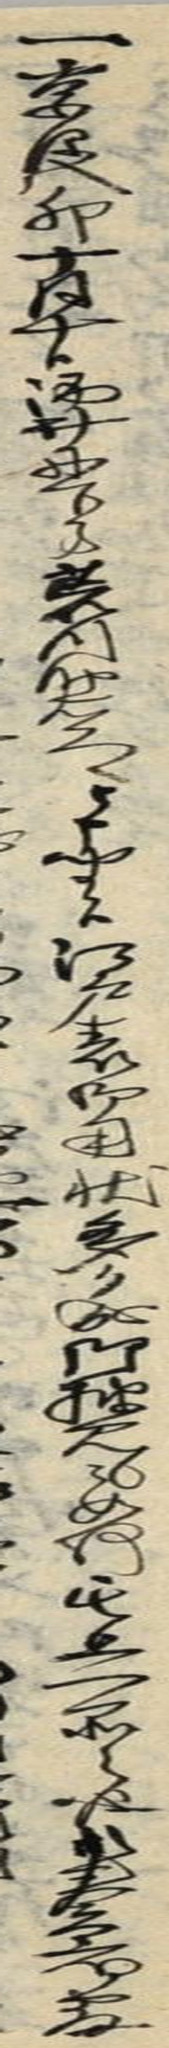一享保八卯十月十日酒井丹下方荒川助右衛門へ被申聞候は江戸表御用状多く成御披見も如何其上一品之儀御奏者番
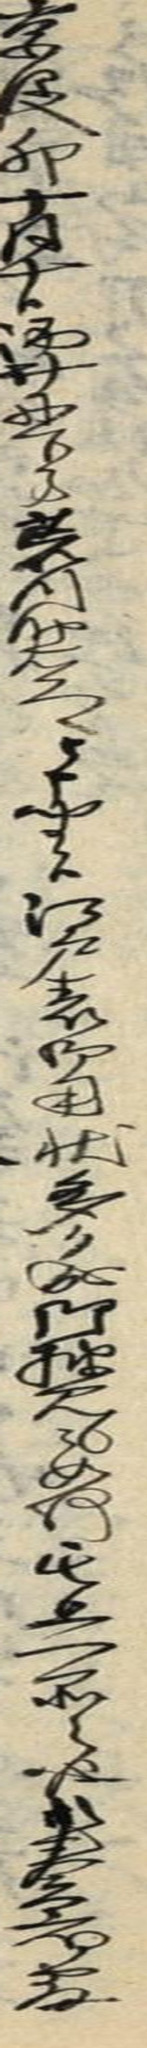一享保八卯十月十日酒井丹下方荒川助右衛門へ被申聞候は江戸表御用状多く成御披見も如何其上一品之儀御奏者番
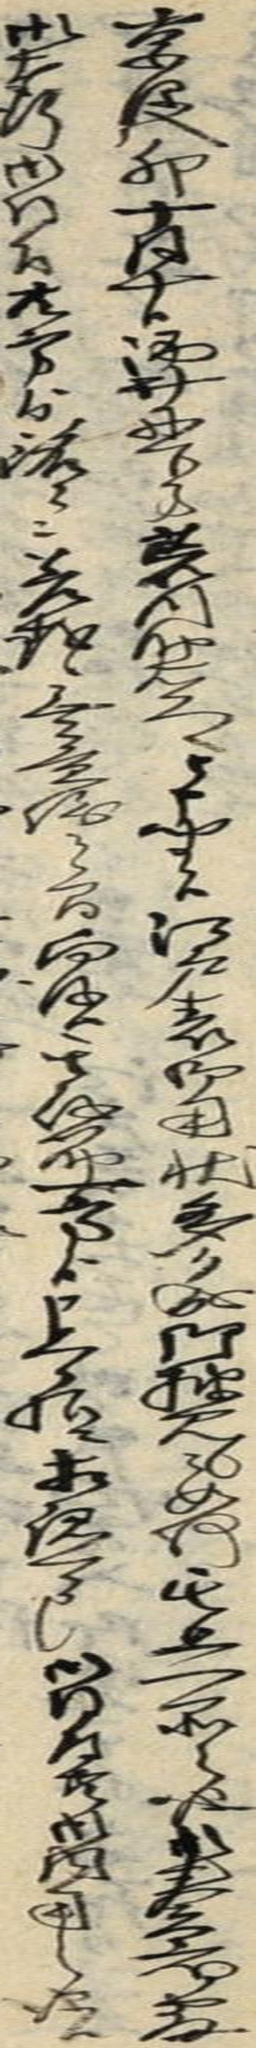御奉行御目付共方ゟ銘々に差越候無宜儀に候間向後は其役筋一方ゟ申上候様に相認可申候御目付共御内用之儀は
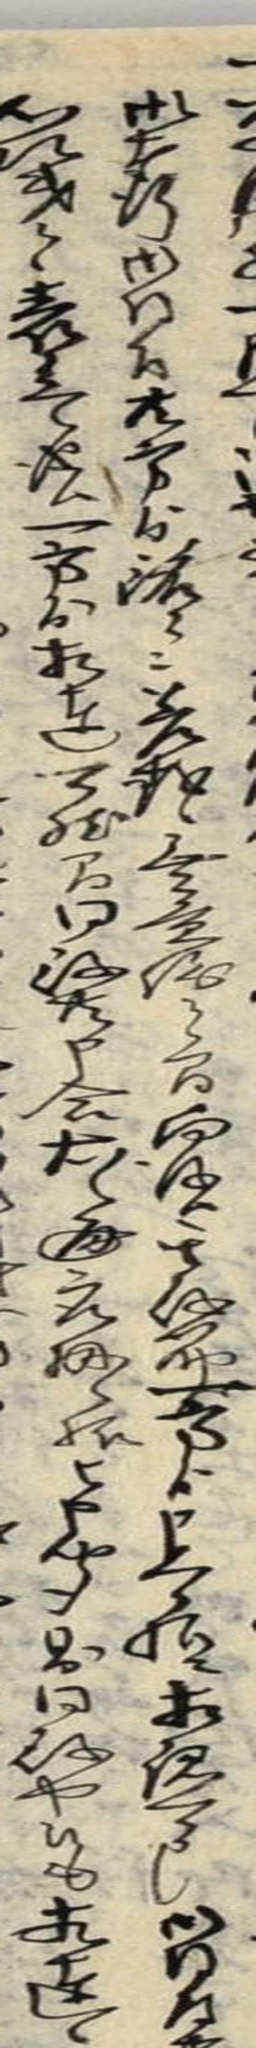心次第に候表立候儀は一方ゟ相達可然間同役共申合右之通取扱候様被申聞則同役中江も相達候
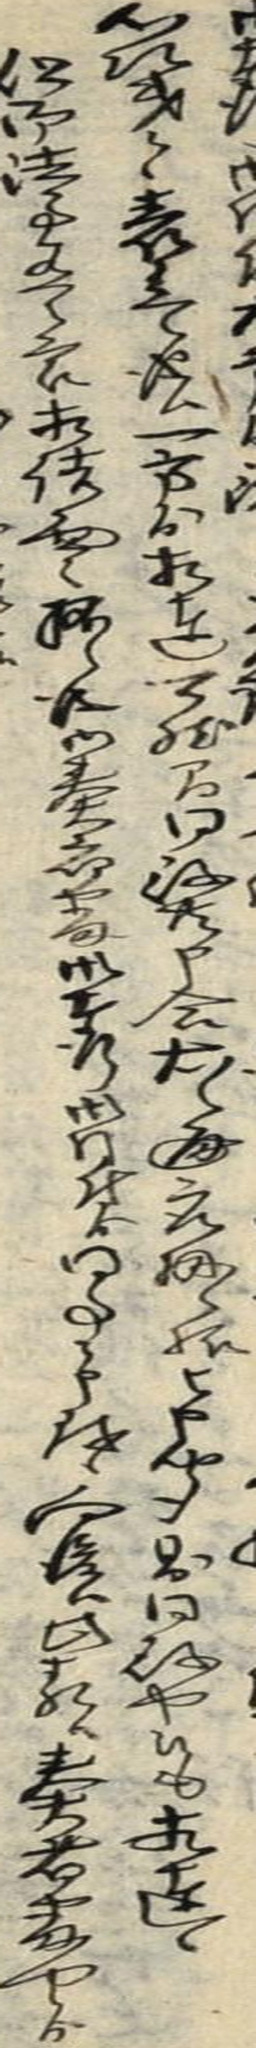但御法事有之節相詰候面々抔之儀御奏者番御奉行御目付ゟ同事に申越候向後は此類は奏者番中ゟ被相達御奉
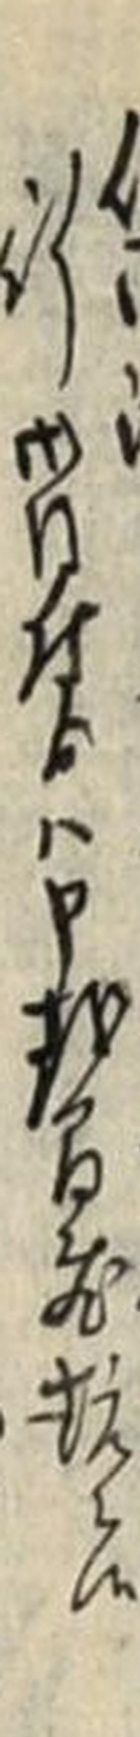行御目付ゟは申越間敷趣に候
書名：蒐輯之部
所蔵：福井県文書館 Fukui Prefectural Archives
